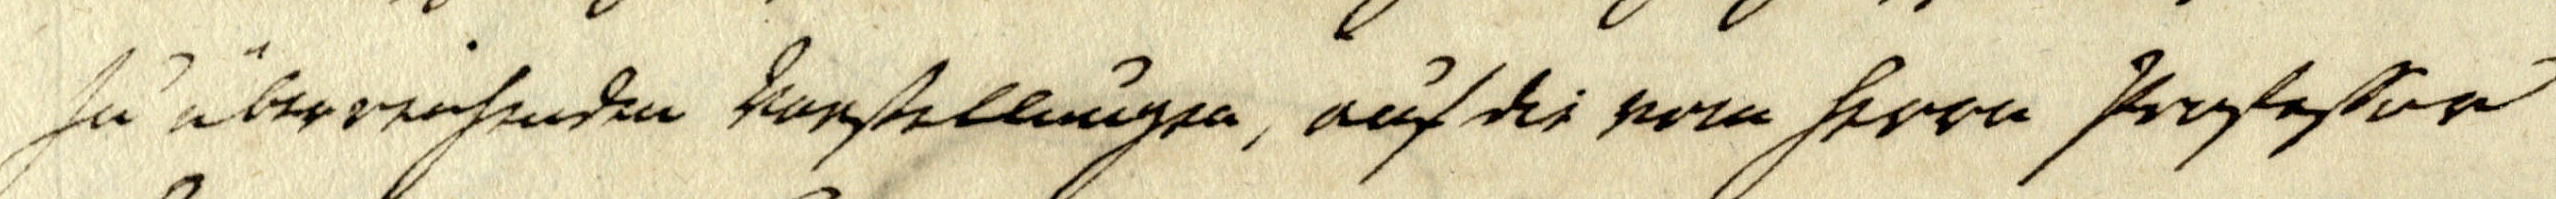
zu überreichenden Vorstellungen, auf die vom herrn Professor
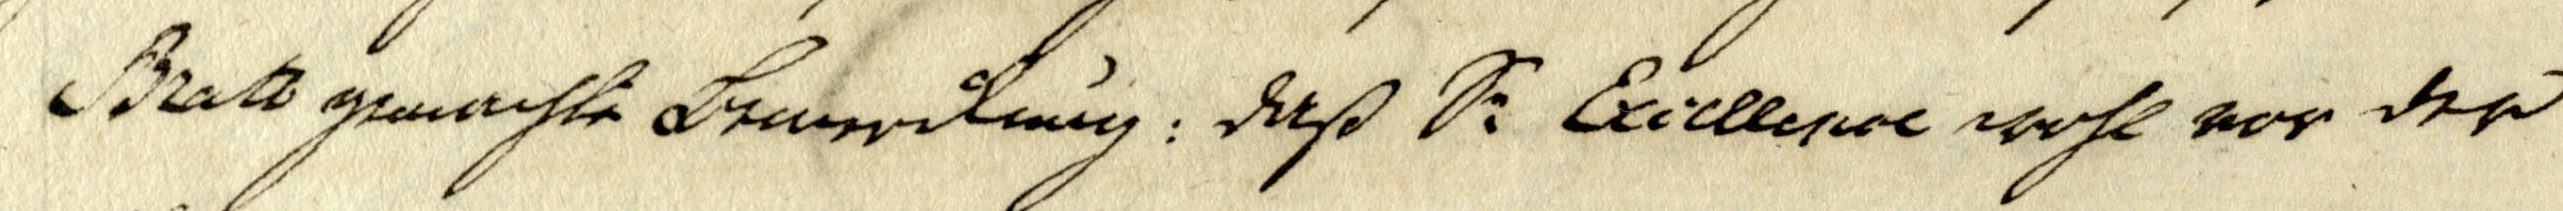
Bratt gemachte Bemerckung: daß Sr. Excellence wohl vor der
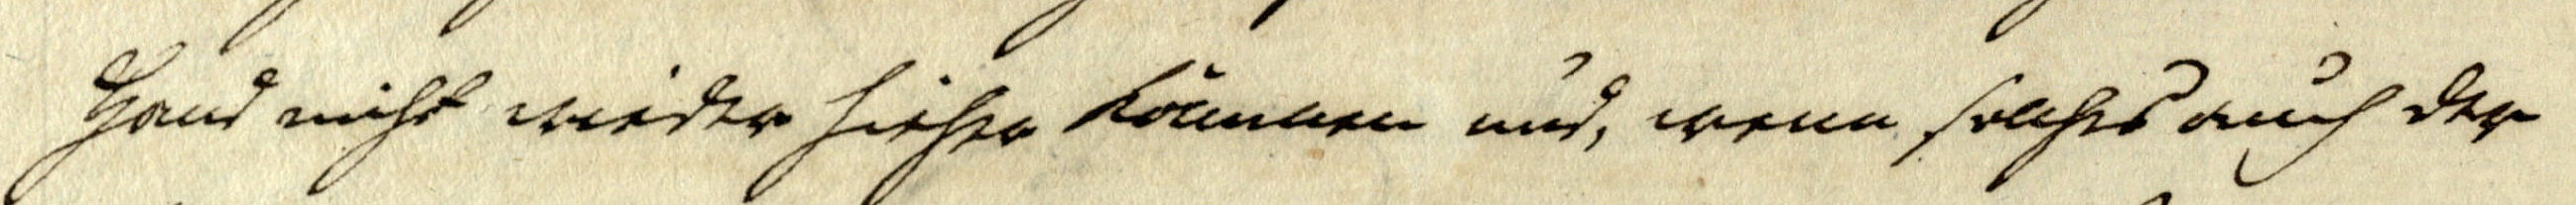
Hand nicht wieder hieher kommen und, wenn solches auch der
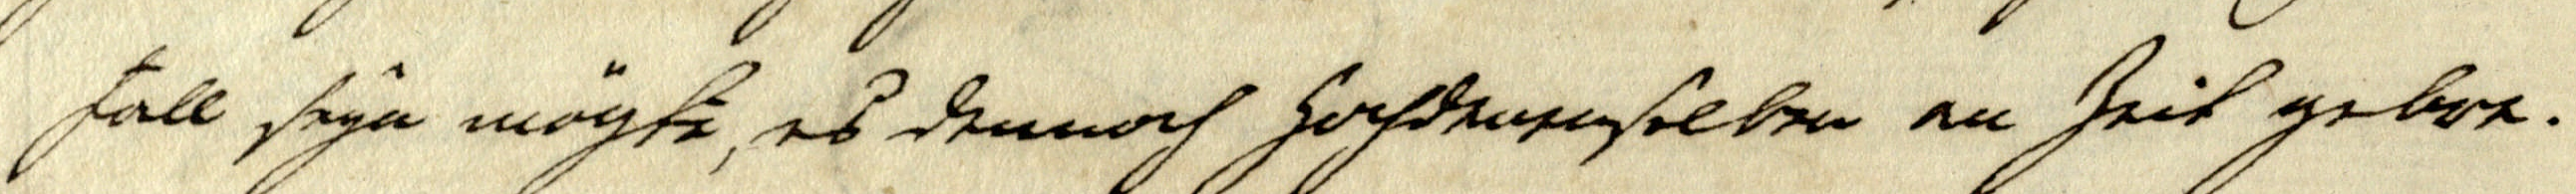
Fall seÿn mögte, es dennoch Hochdemselben an Zeit gebre¬
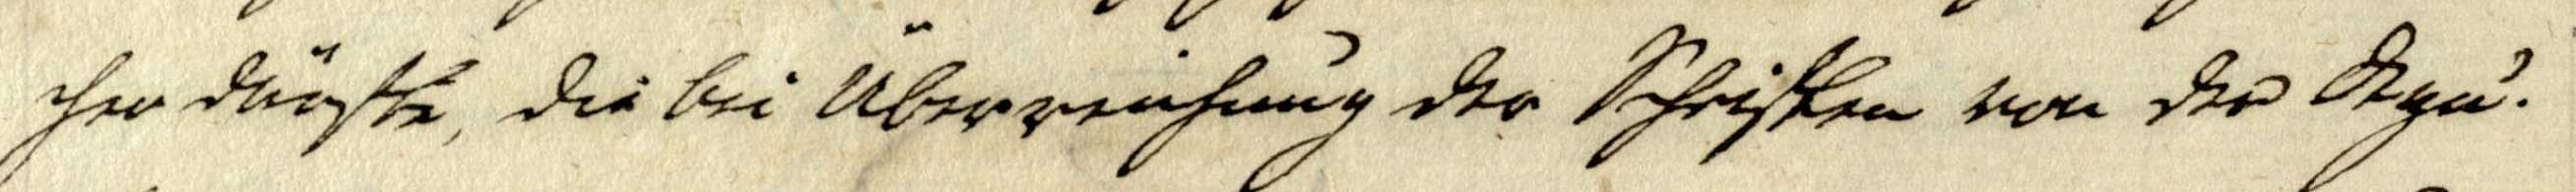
chen dürfte, die bei Überreichung der Schriften von der Depu¬
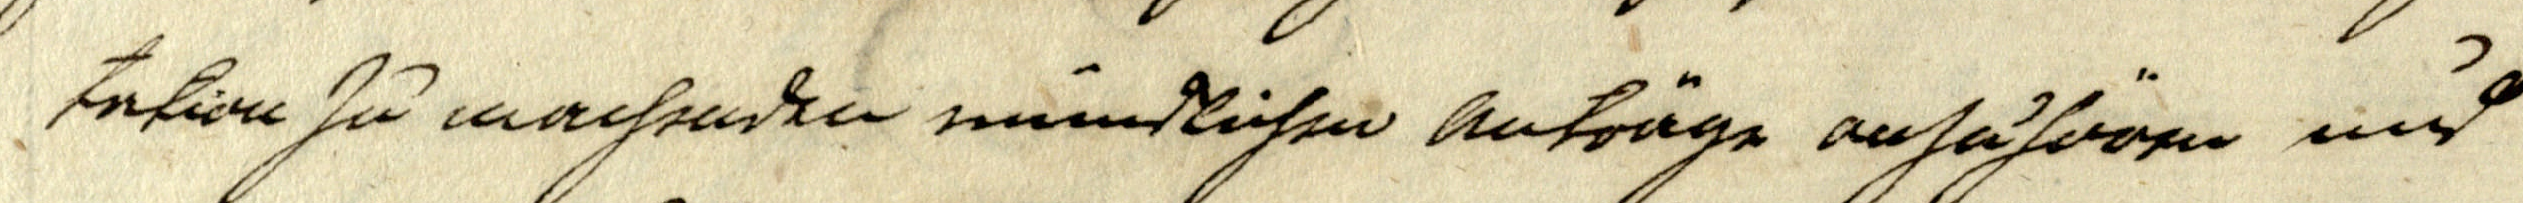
tation zu machenden mündlichen Anträge anzuhören und
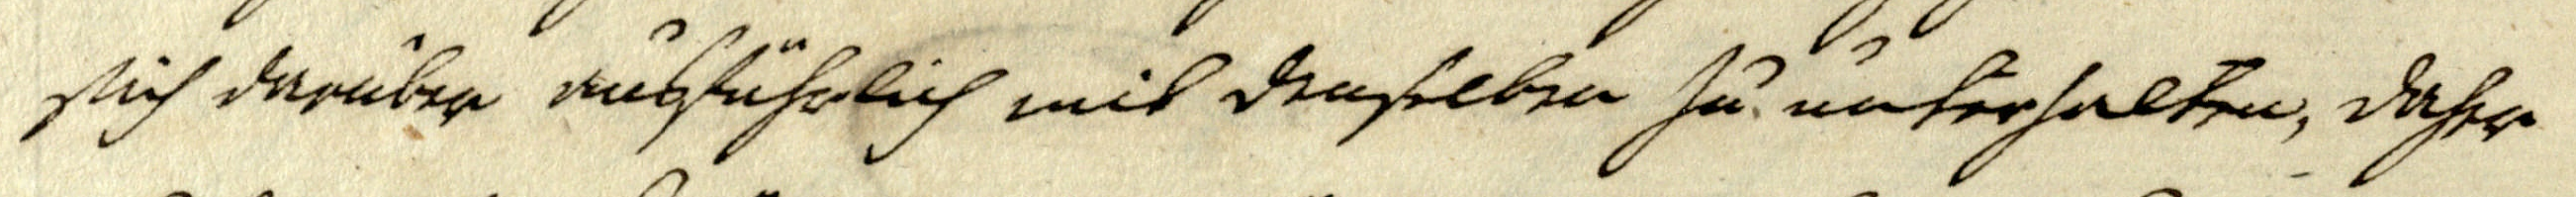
sich darüber ausführlich mit denselben zu unterhalten, daher
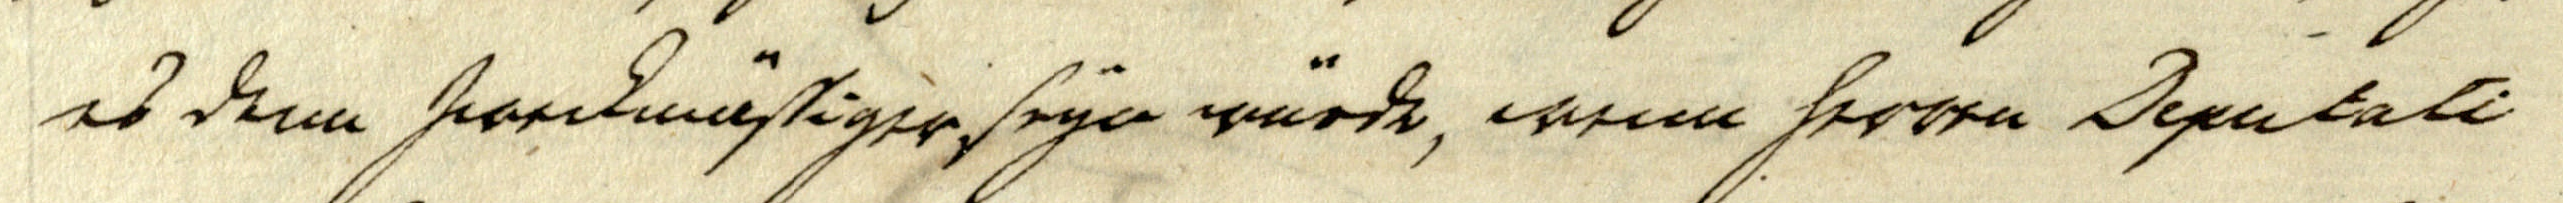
es denn zweckmässiger seÿn würde, wenn herren Deputati
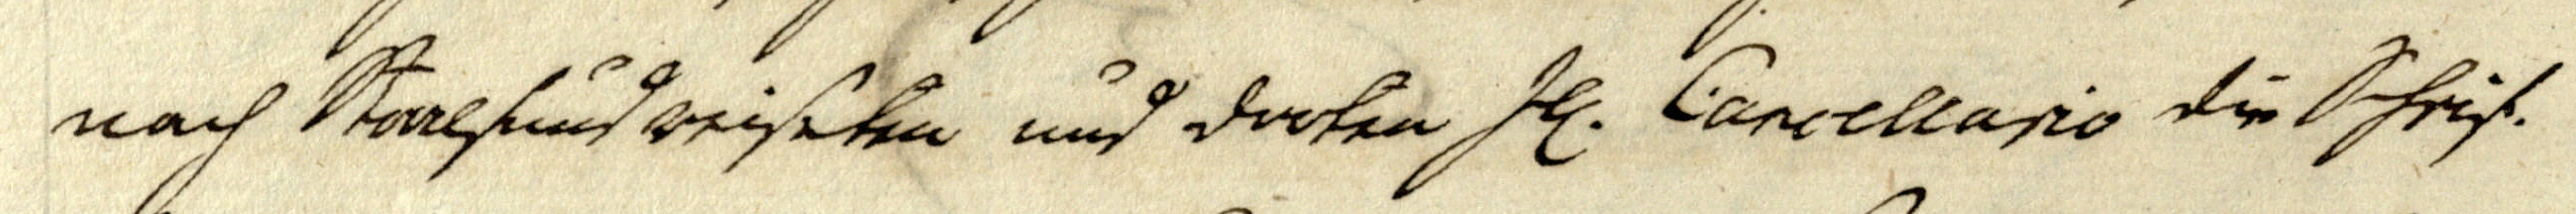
nach Stralsund reiseten und dorten Ill. Cancellario die Schrif¬
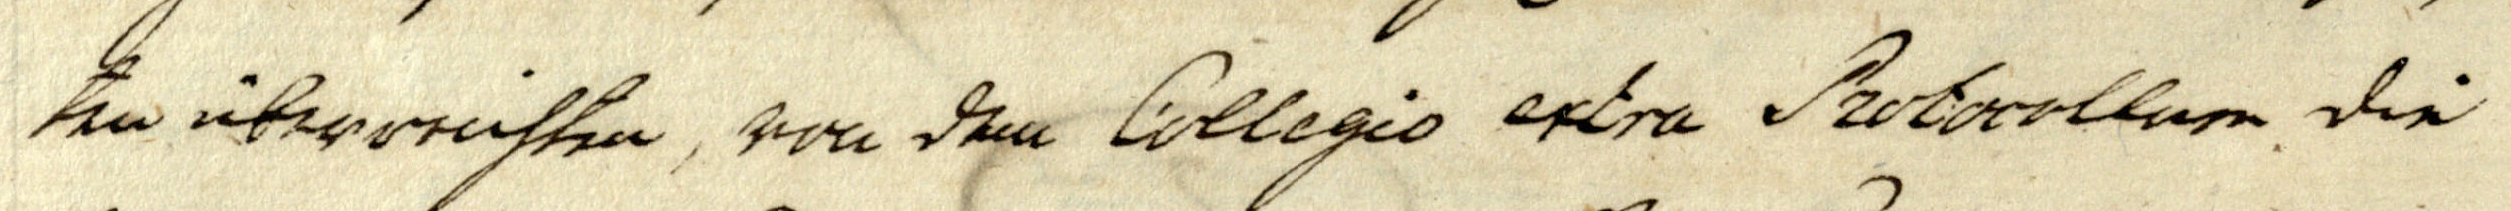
ten überreichten, von dem Collegio extra Protocollum der
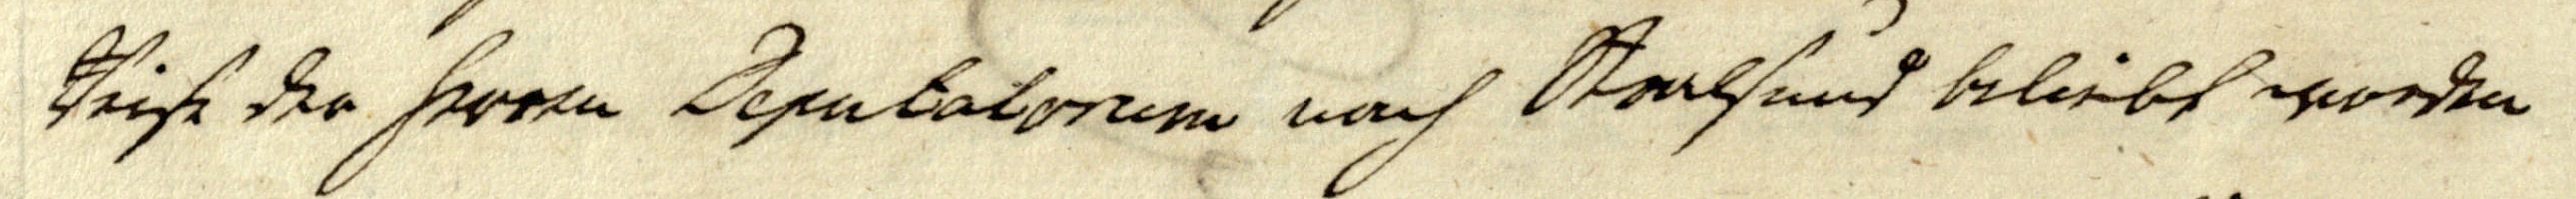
Reise der herren Deputatorum nach Stralsund beliebt worden
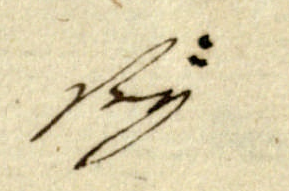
seÿ
